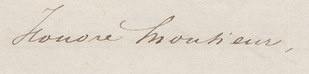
Honoré Monsieur,
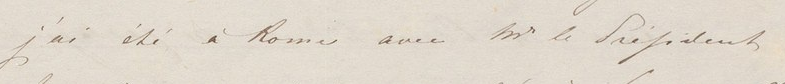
j'ai été à Rome avec Mr le Président
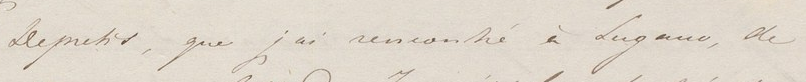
Depretis, que j'ai rencontré à Lugano, de
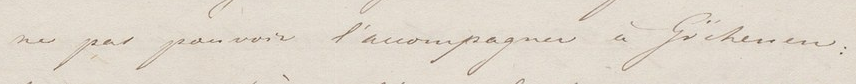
ne pas pouvoir l'accompagner à Gö chenen:
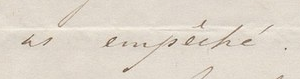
as empêché.
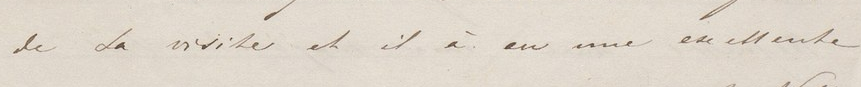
de sa visite et il à eu une excellente
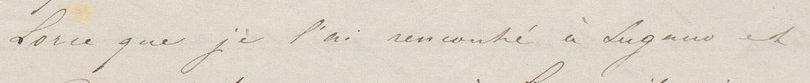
Lorse que je l'ai rencontré à Lugano et
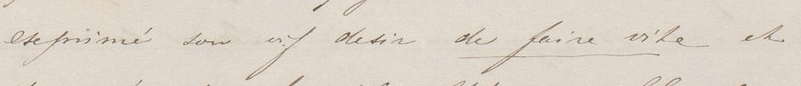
exprimé son vif desir de faire vite et
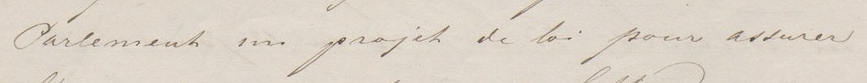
Parlement un projet de loi pour assurer
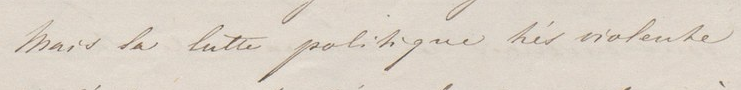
Mais la lutte politique très violente
